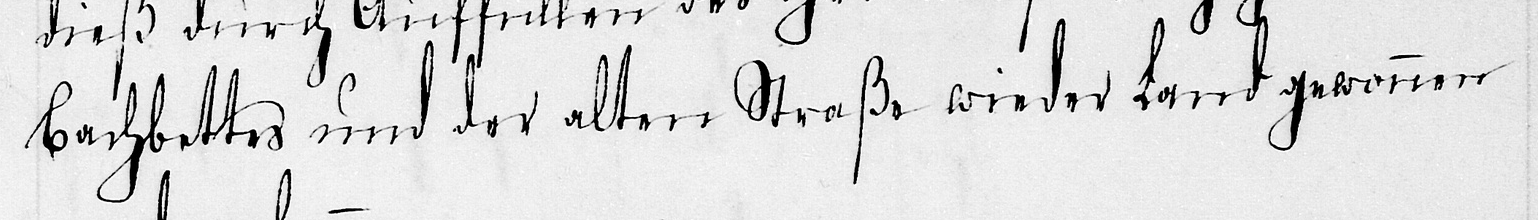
Bachbettes und der alten Straße wieder Land gewonnen
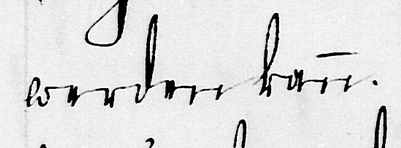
werden kann.
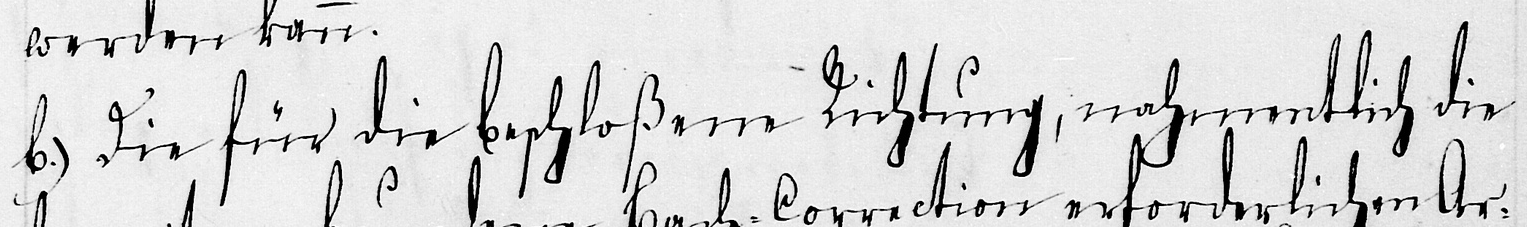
b.) Die für die beschloßene Richtung, nahmentlich die
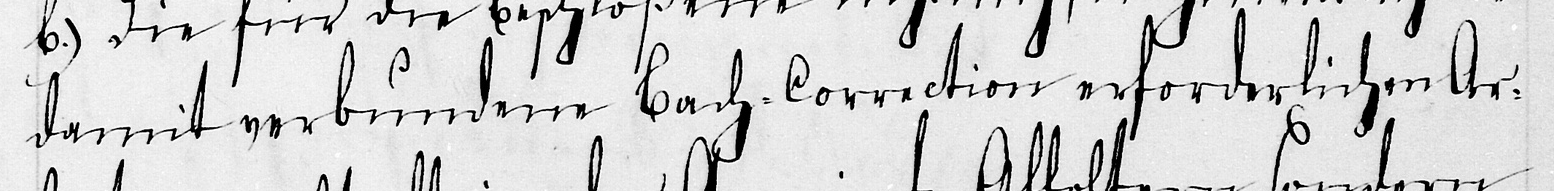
damit verbundene Bach-Correction erforderlichen Ar¬
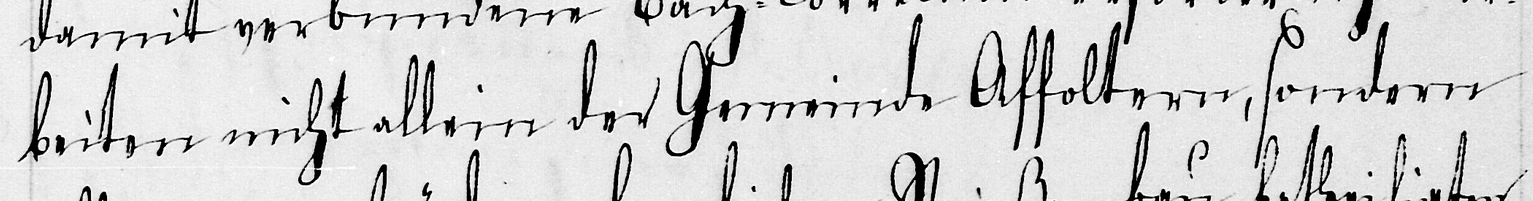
beiten nicht allein der Gemeinde Affoltern, sondern
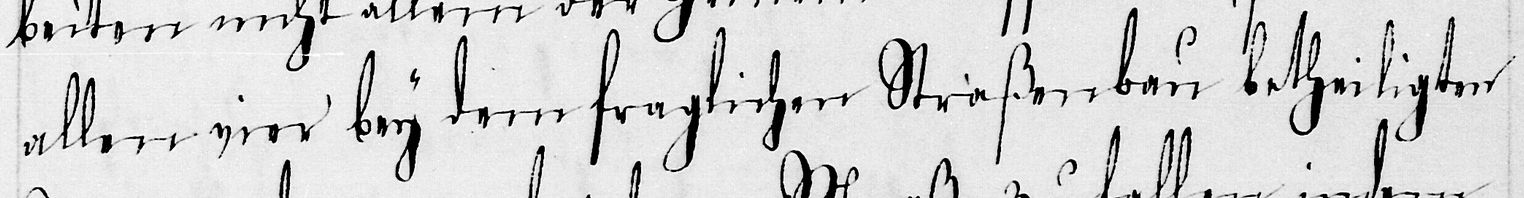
allen vier bey dem fraglichen Straßenbau betheiligten
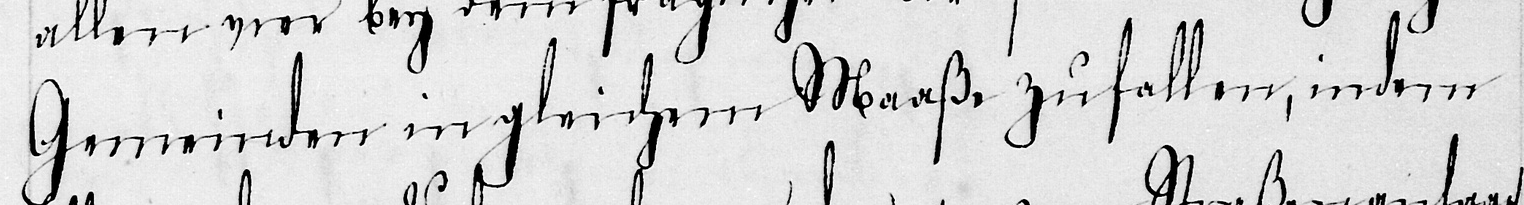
Gemeinden in gleichem Maaße zufallen, indem
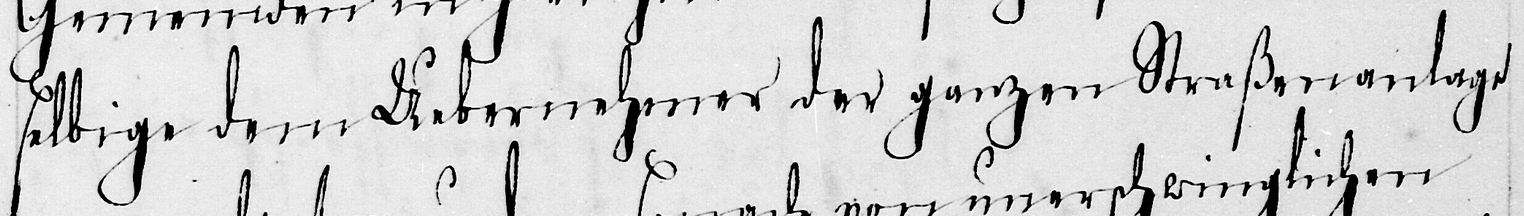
selbige dem Uebernehmer der ganzen Straßenanlage
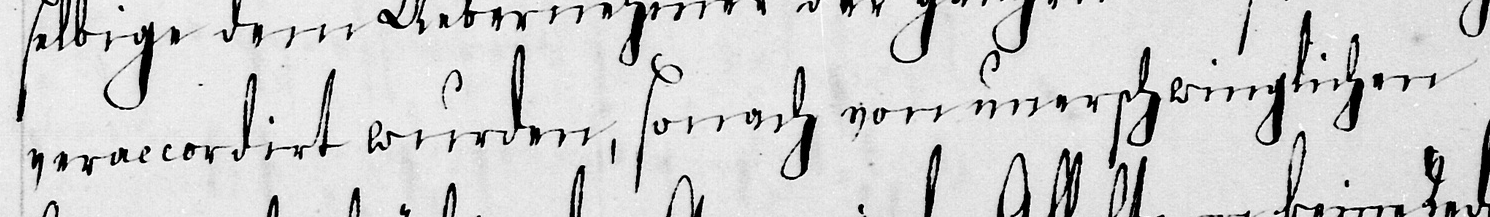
veraccordirt wurden, sonach von unerschwinglichen
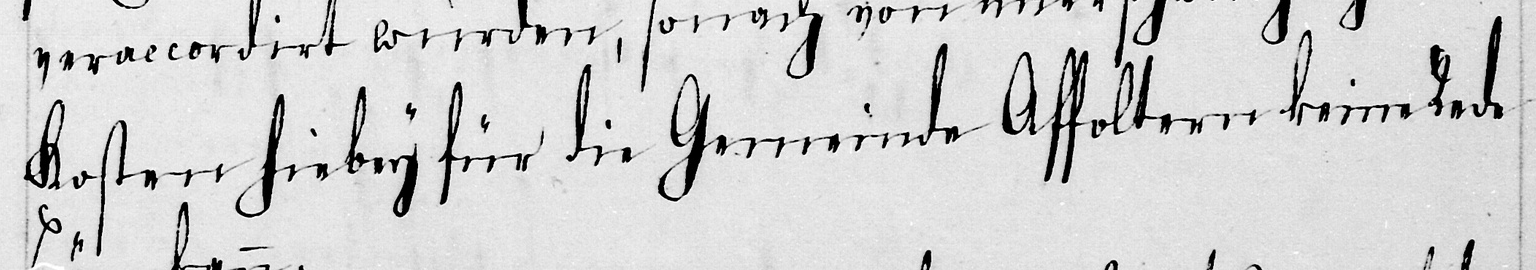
Kosten hiebey für die Gemeinde Affoltern keine Rede
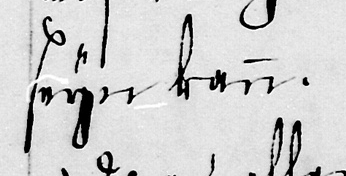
seyn kann.
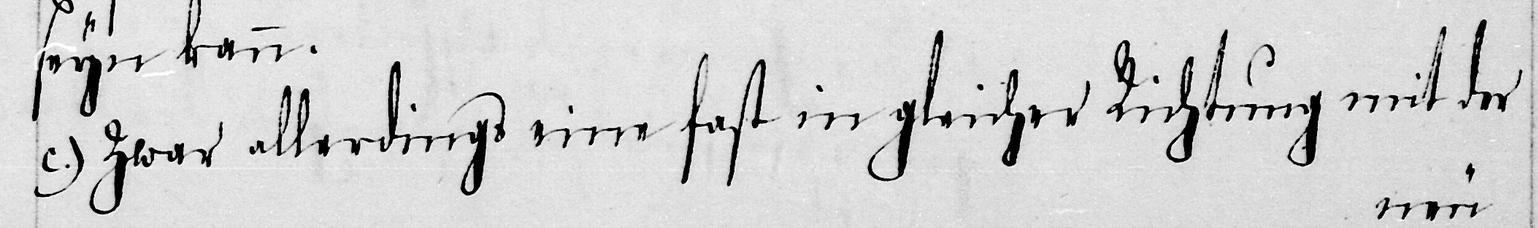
c.) Zwar allerdings eine fast in gleicher Richtung mit der
